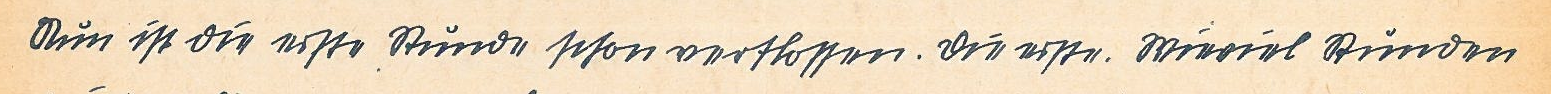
Nun ist die erste Stunde schon verflossen. Die erste. Wieviel Stunden
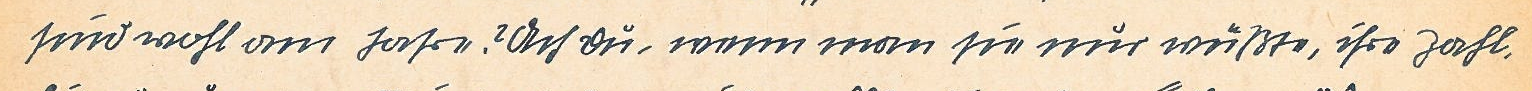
sind wohl am Jahre? Ach Du, wenn man sie nur wüßte, ihre Zahl
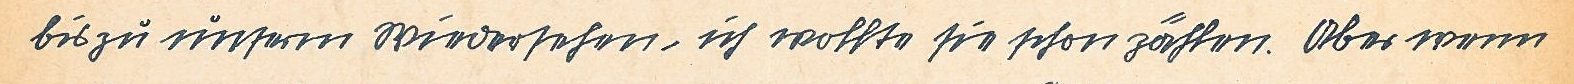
bis zu unserm Wiedersehen, ich wollte sie schon zählen. Aber wenn
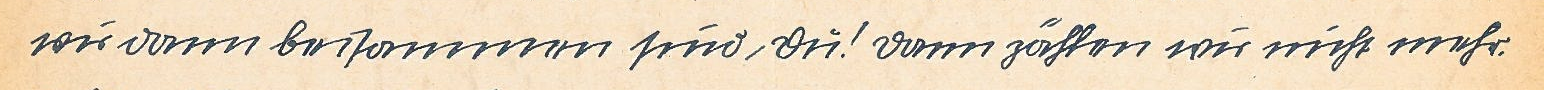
wir dann beisammen sind, Du! Dann zählen wir nicht mehr.
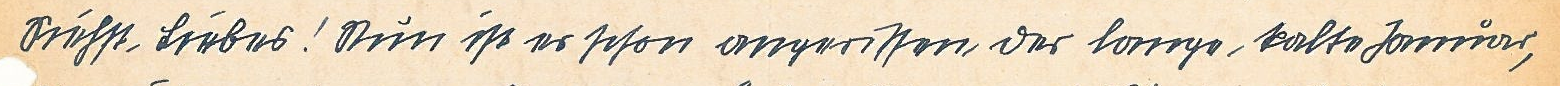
Siehst, Liebes? Nun ist er schon angerissen, der lange, kalte Januar,
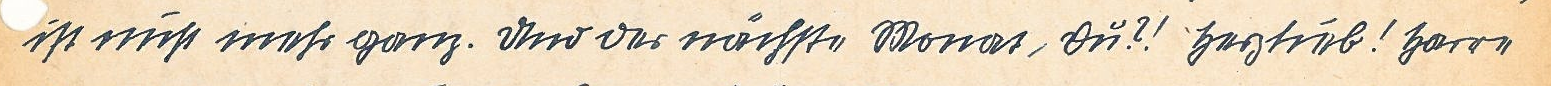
ist nicht mehr ganz. Und der nächste Monat, Du?! Herzlieb! Harre
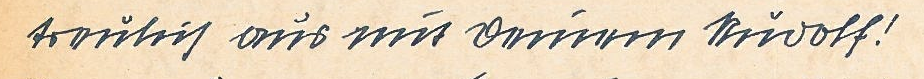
treulich aus mit Deinem Rudolf!
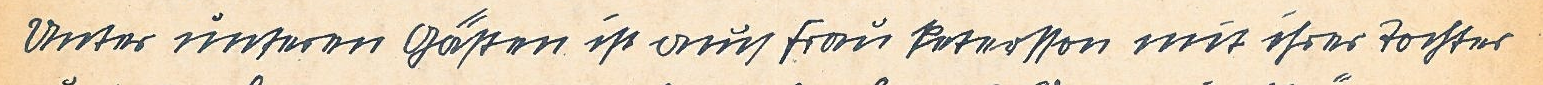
Unter unseren Gästen ist auch Frau P. mit ihrer Tochter
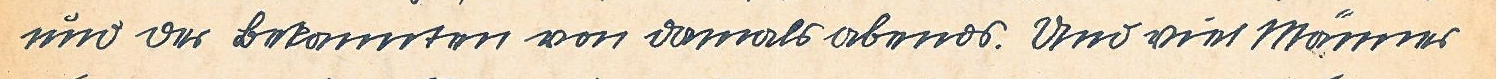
und der Bekannten von damals abends. Und viel Männer
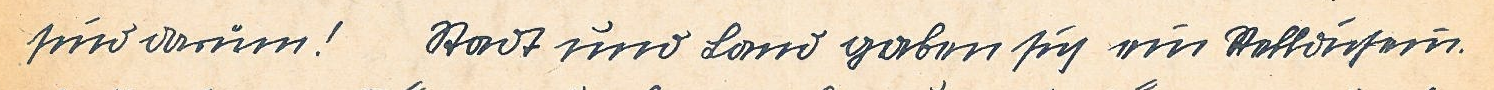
sind darum! Stadt und Land geben sich ein Stelldichein.
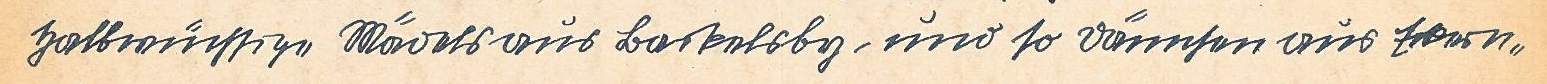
Halbwüchsige Mädels aus B. und Dämchen aus E.
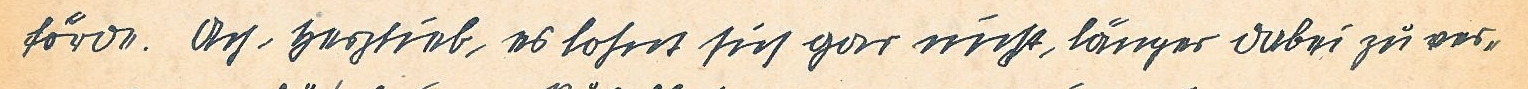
Ach, Herzlieb, es lohnt sich gar nicht, länger dabei zu ver¬
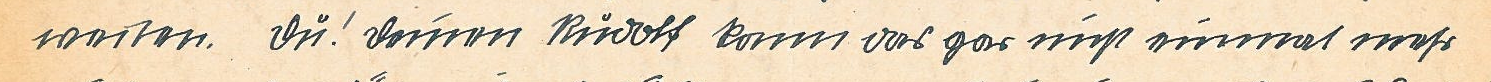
weilen. Du! Deinen kann das gar nicht einmal mehr
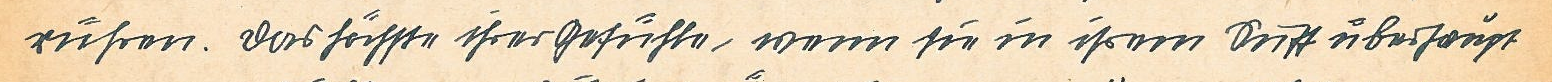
rühren. Das höchste der Gefühle, wenn sie in ihrem Suff überhaupt
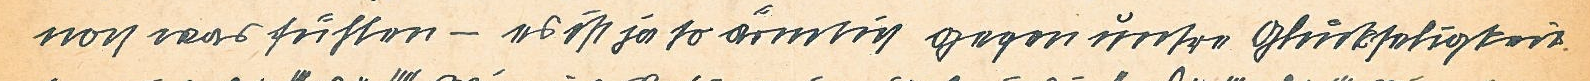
noch was fühlen — es ist ja ärmlich gegen unsre Glückseligkeit.
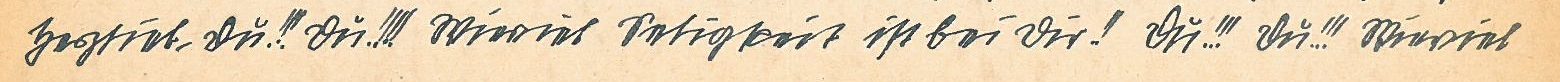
Herzlieb, Du!!! Du!!! Wieviel Seligkeit ist bei Dir!! Du!!! Du!!! Wieviel
